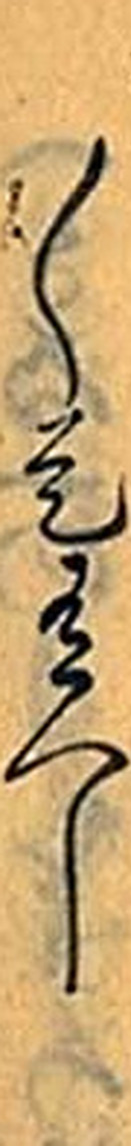〳〵是有へし
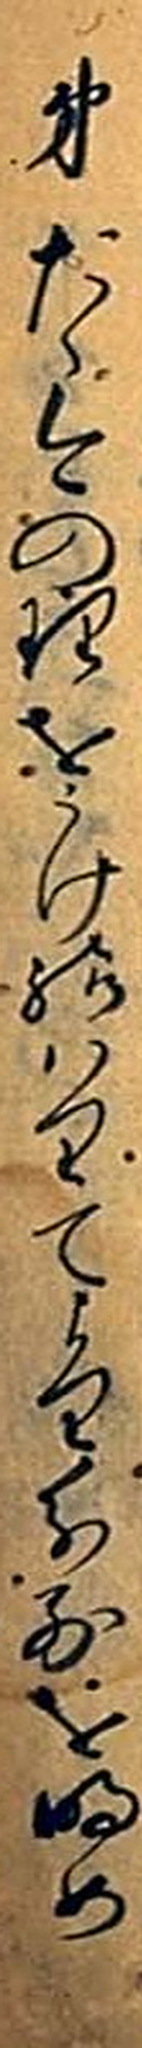弟たゝ今の理をうけ給はりてより分別を明め

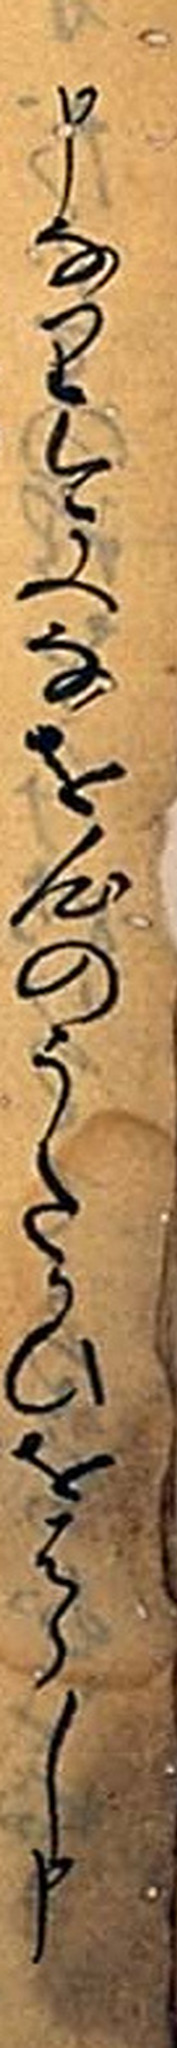申なり今又なを心のうたかひをはらし申
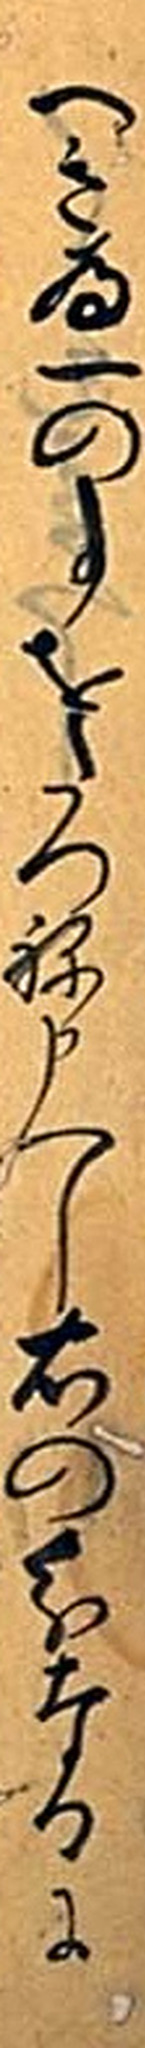へき為一の事をたつね申へし右の分なるに
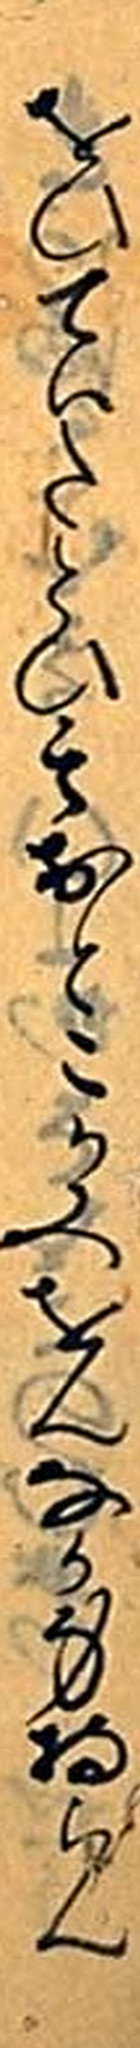をひてはたとひ其おとこか又をんなか身持らん
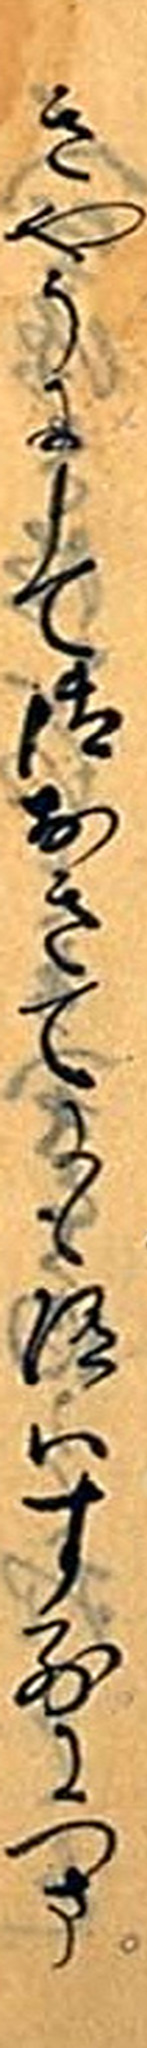きやうにして御おきてにも随はす別につま
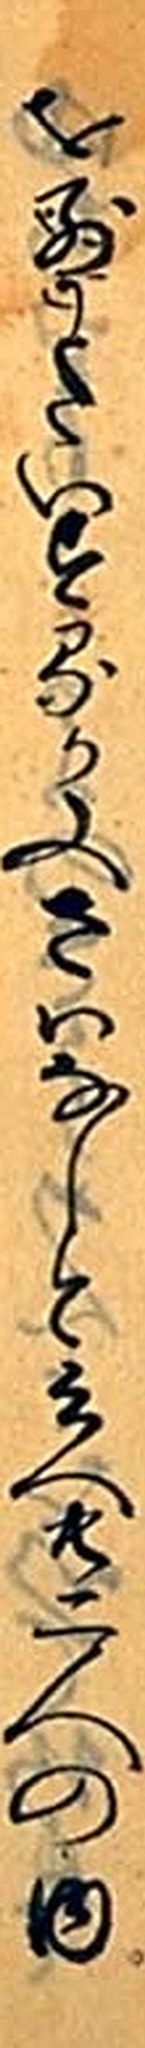を別にたいするか又さはなしと云へ共二人の内
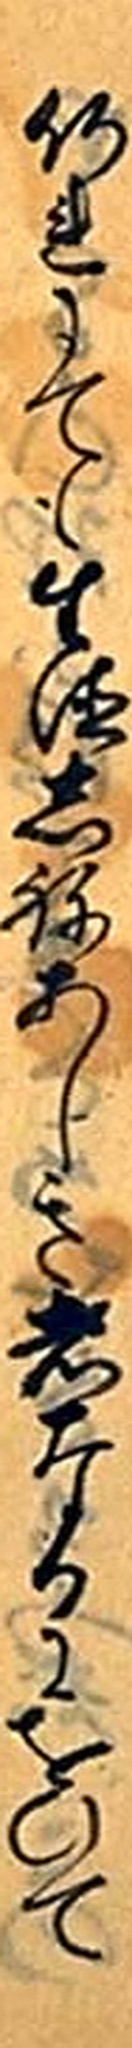何れにても生徳しねあしき者なるにをひて
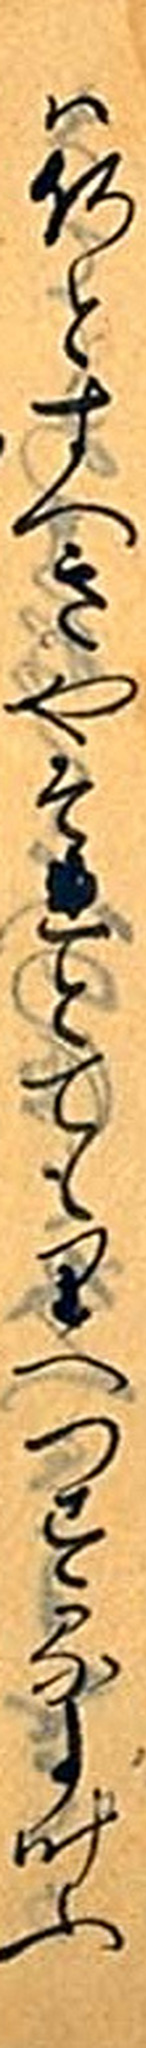は何とすへきやそれとてもりへつする事叶ふ
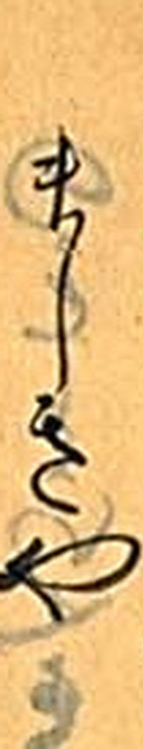ましきや
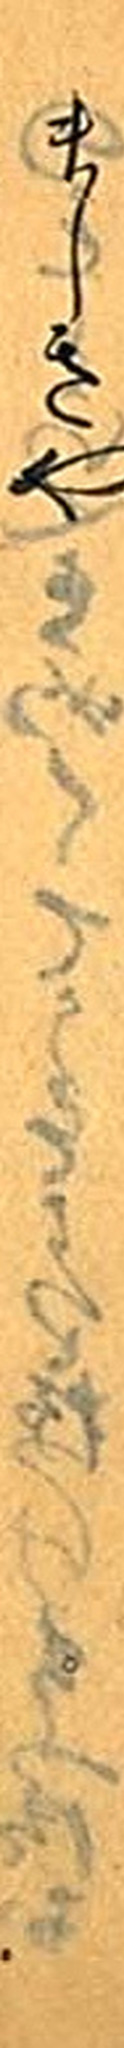ましきや
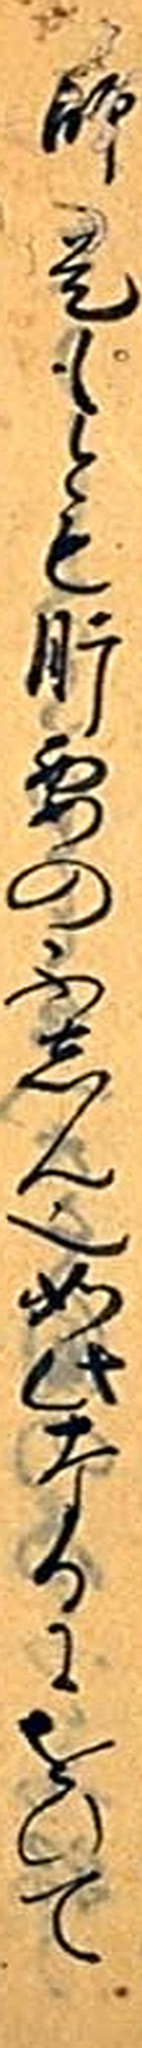師是もとも肝要のふしん也如此なるにをひて
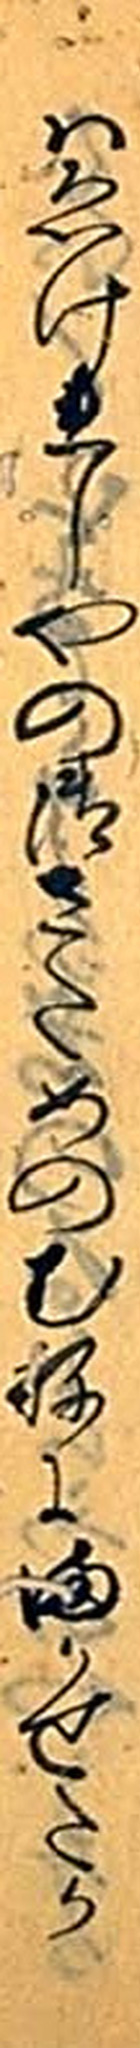はゑけれしやの御さためのむねにまかせたか
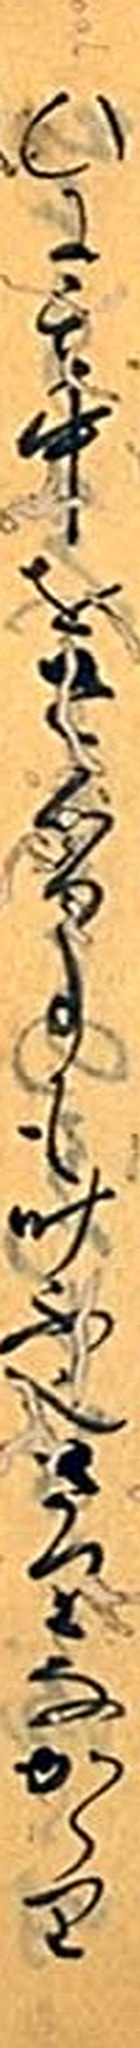ひに其中をさくる事も叶ふ也さりなからり
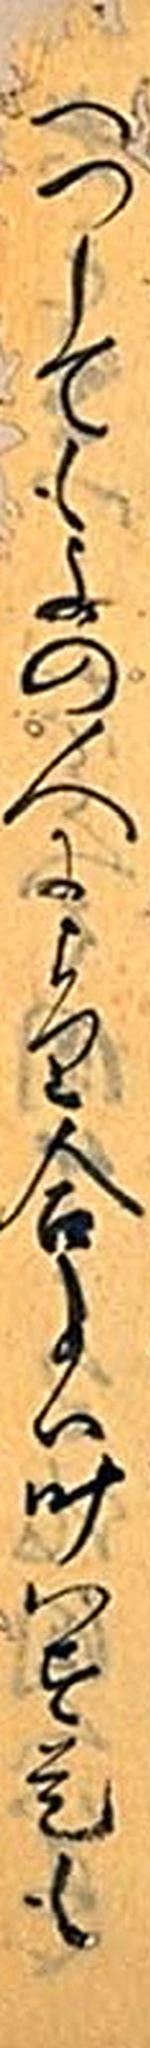へつしてもよの人により合事は叶はす是も
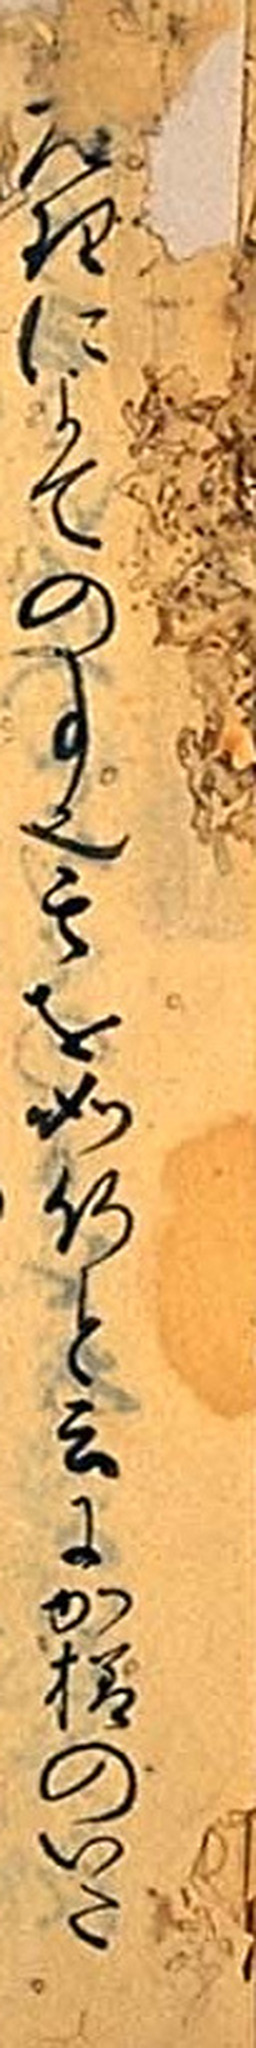道理によての事なり其を如何と云にか様のいた
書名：ドチリナ・キリシタン
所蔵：東京大学総合図書館 / General Library in the University of Tokyo
